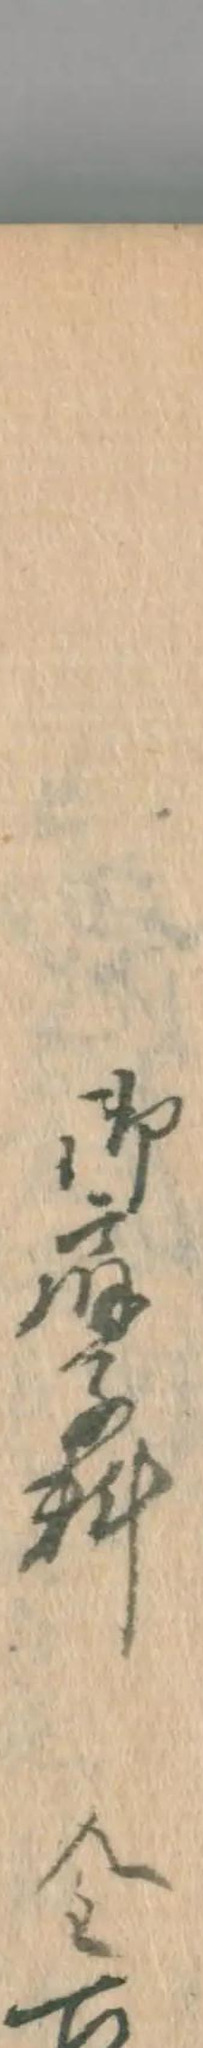御扇子料金弐百疋
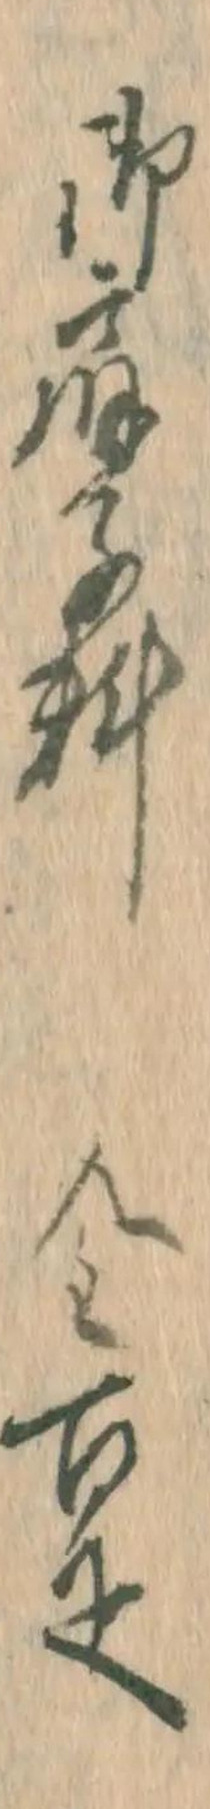御扇子料金弐百疋

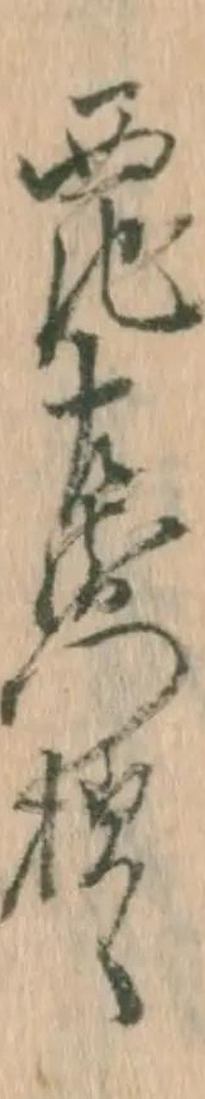西池左衛門様へ
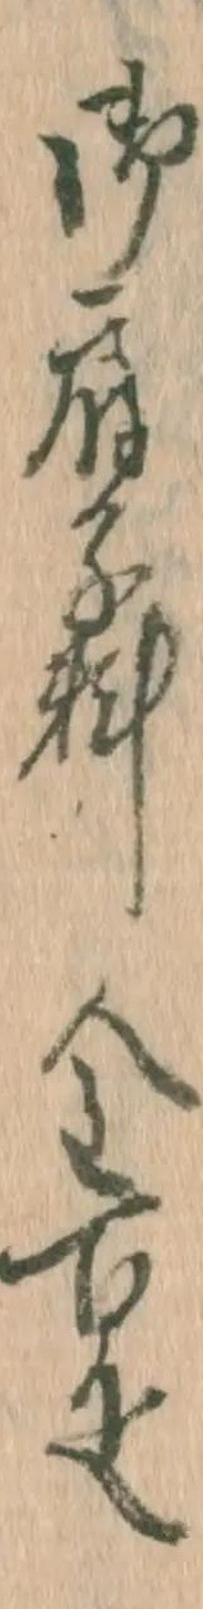御扇子料金百疋
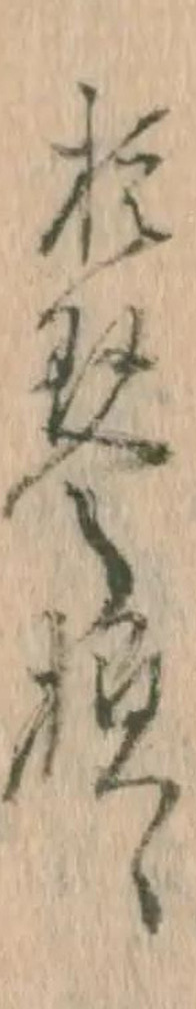於琴様へ
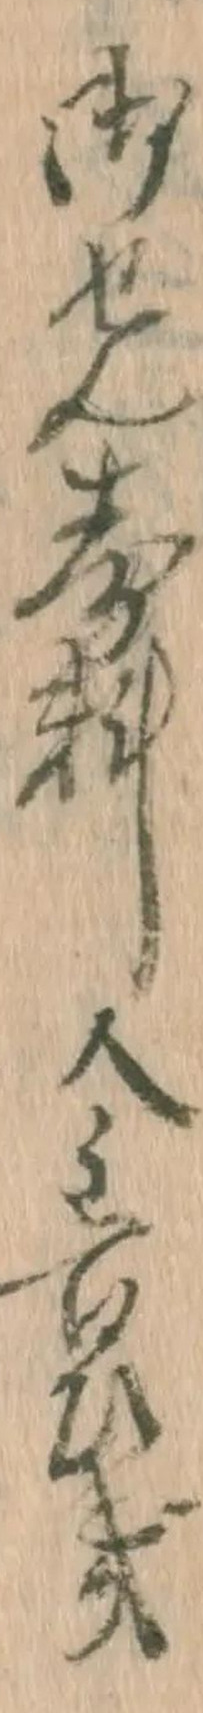御せんす料金百ひき
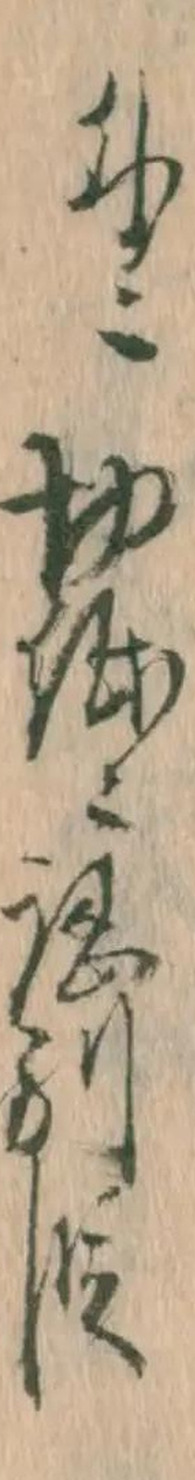外ニ切紙ニ認別段
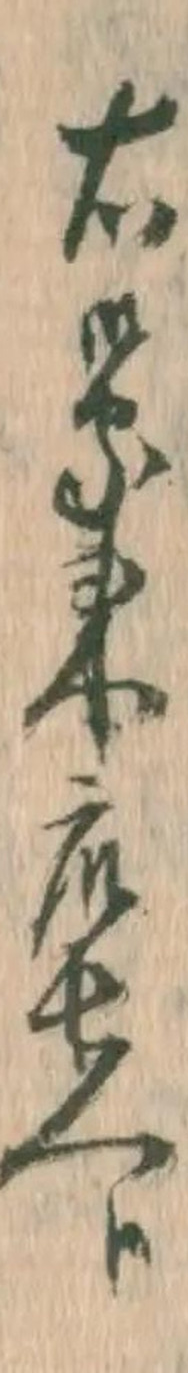右御家来衆七人え
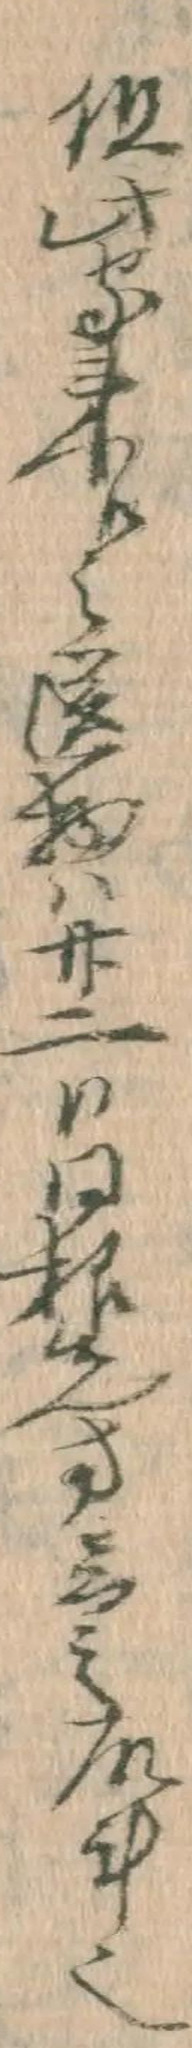但此家来江之送物ハ廿二日同様先方ニ而之取斗也
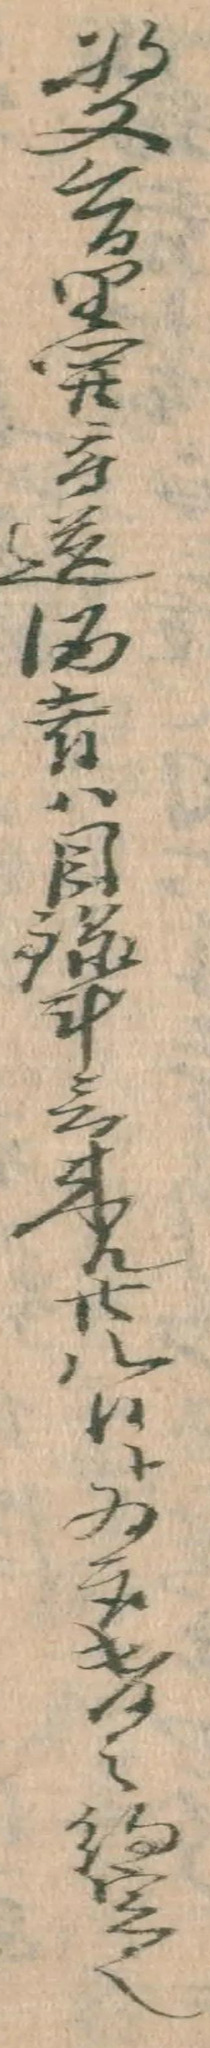将又今日里開ニ付送酒肴ハ目録斗ニ而来ル廿八日ト為取出ル之約定也
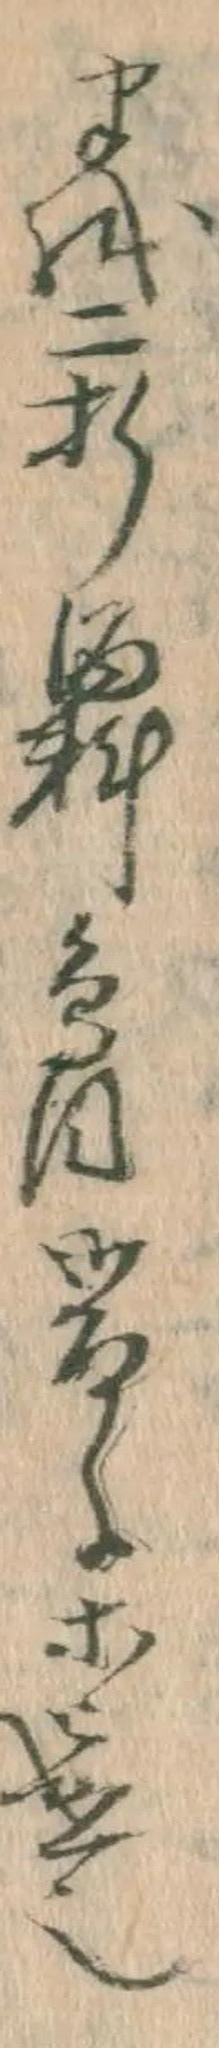半紙二折溜料鳥目弐百文等被遣也
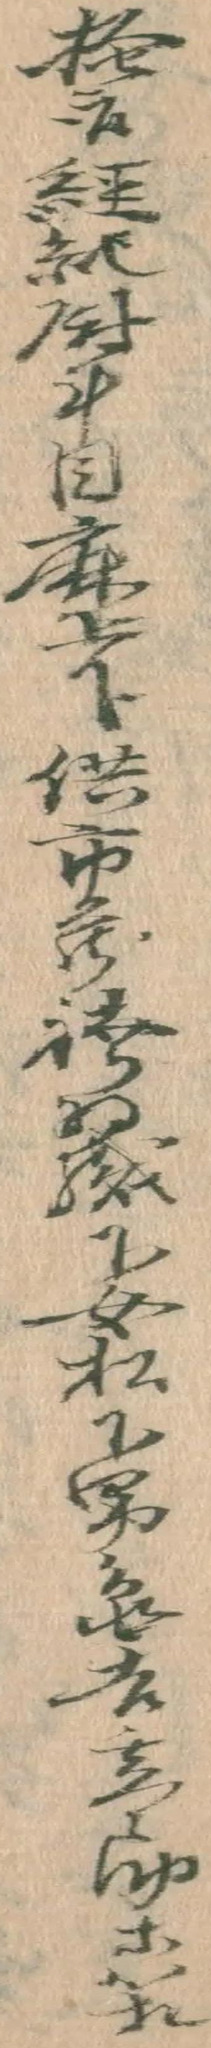捲取経紀尉斗目麻上下供市蔵袴羽織下女松下男亀吉亥之助等箱
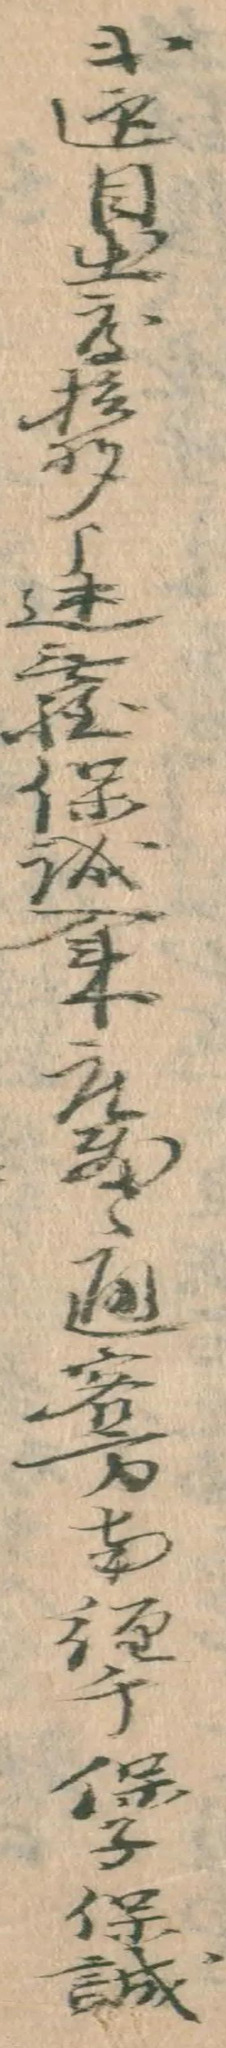出迎目出度挨拶申述無程保誠入来座敷候通客方南経千保子保誠

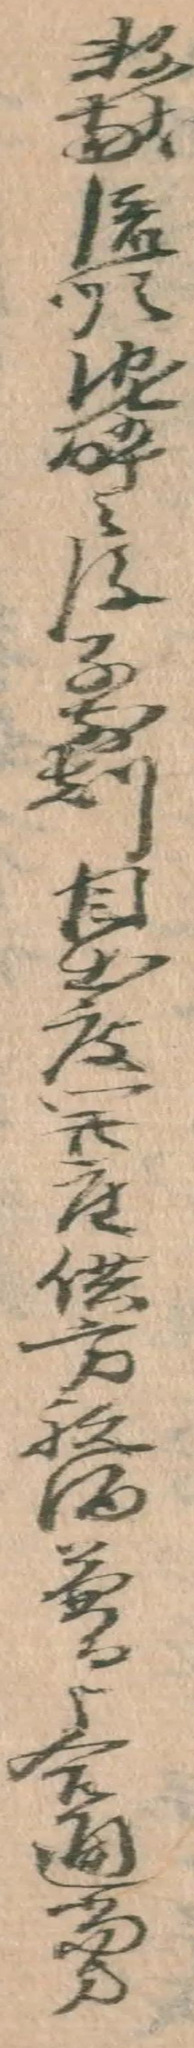数献流順沈酔之後子前刻目出度開座供方祝酒兼而被合通當方
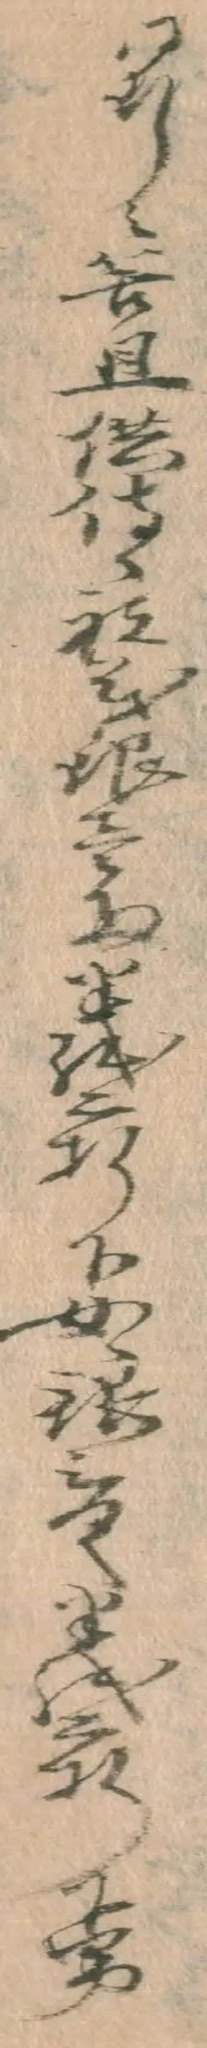同断之筈且供侍ヘ祝義銀壱両半紙二折下女へ銀三匁半紙二折下男
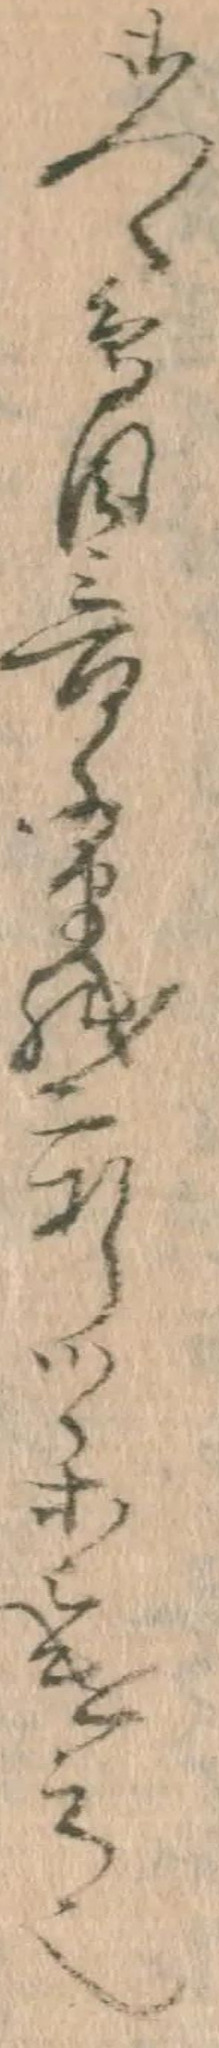弐人へ鳥目三百文半紙二折ツヽ等被遣之也
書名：賀茂社記録. 第69冊
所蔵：国立国会図書館 National Diet Library, JAPAN
